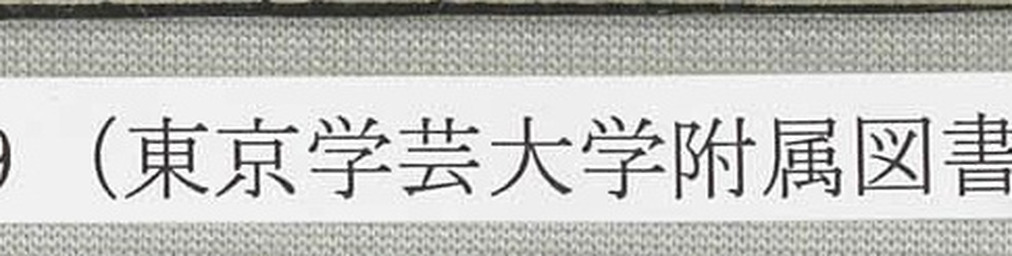東京学芸大学蔵書
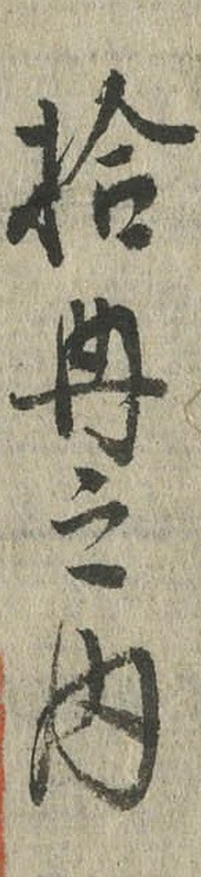拾冊之内
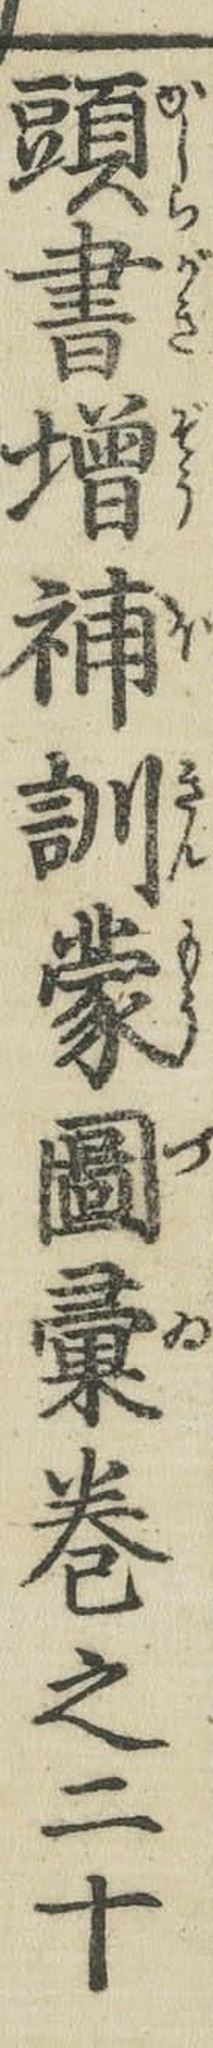頭書増補訓蒙図彙巻之二十
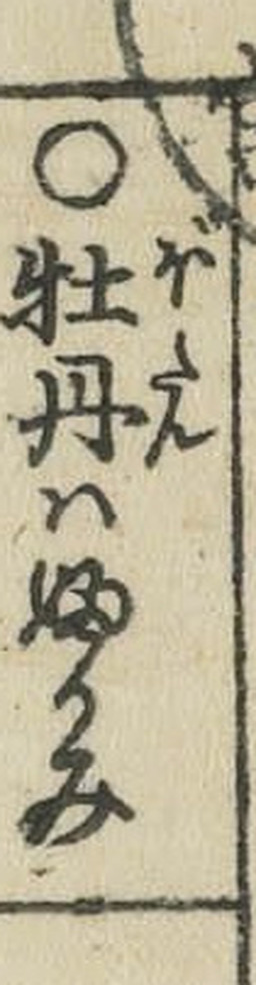○牡丹はふかみ
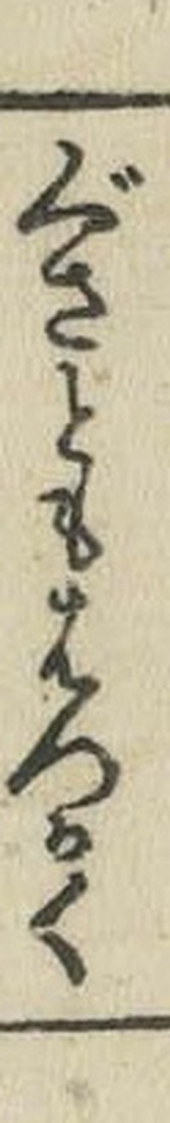ぐさともはつかく
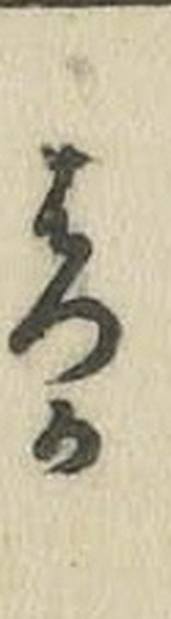はつか
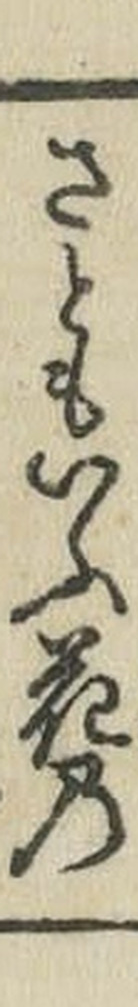さともいふ花の
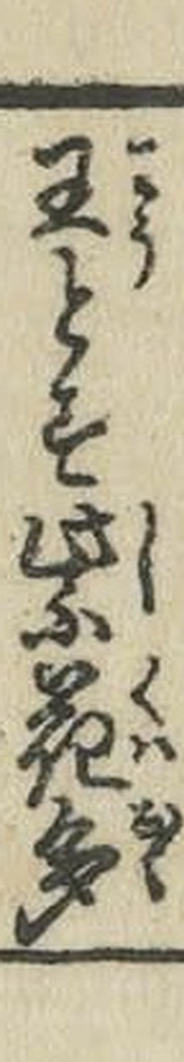王とす紫花多
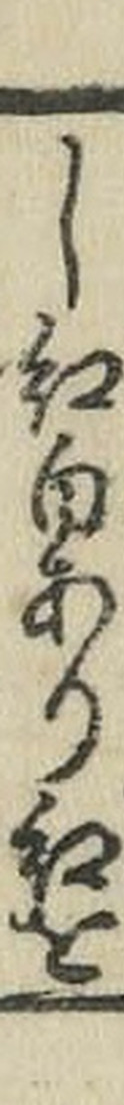し紅白あり紅を
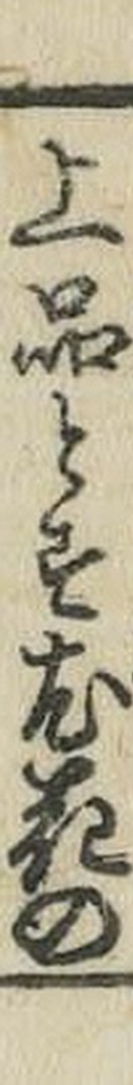上品とす尤花の
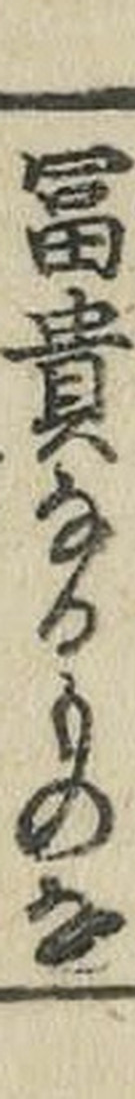富貴なるものな
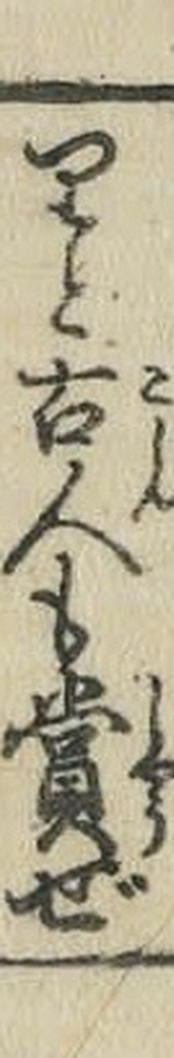りと古人も賞ぜ
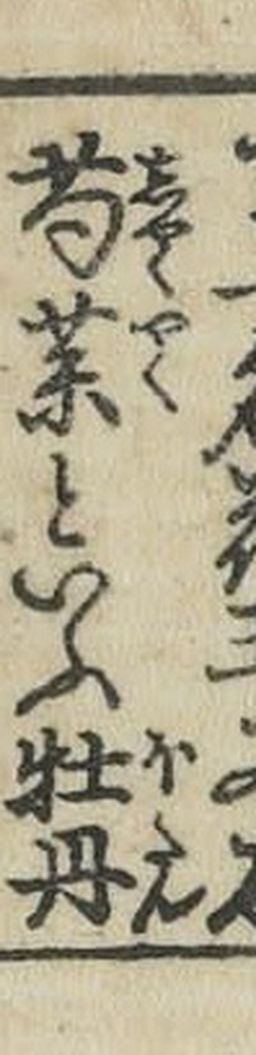芍薬といふ牡丹
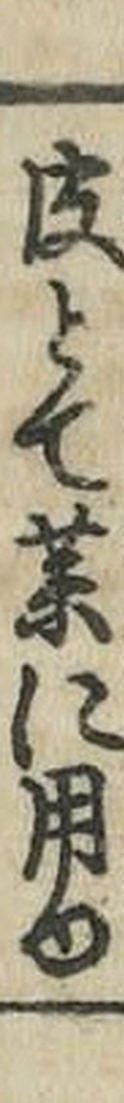皮とて薬に用ゆ

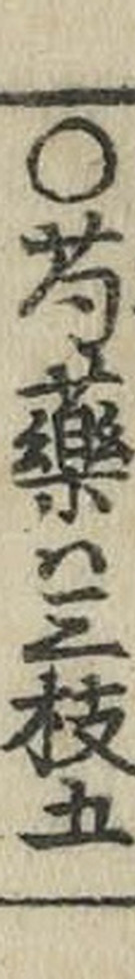○芍薬は三枝五
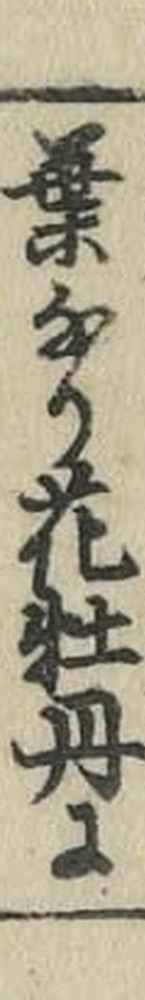葉なり花牡丹に
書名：増補頭書訓蒙図彙大成 10巻 9:巻之20
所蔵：東京学芸大学教育コンテンツアーカイブ
